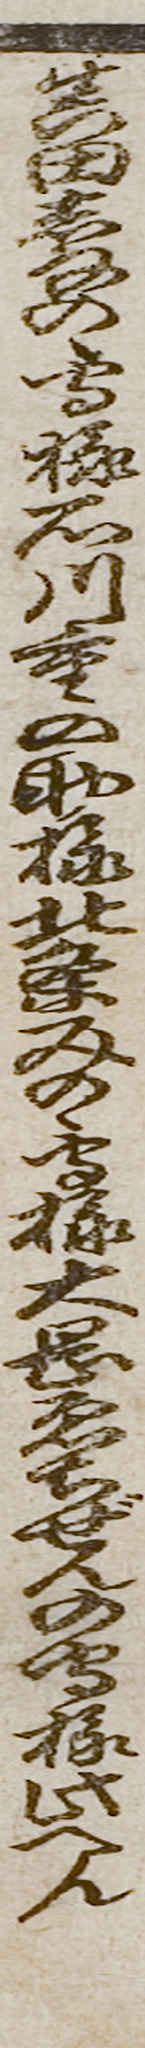真田しなの守様石川重の助様北條みのゝ守様大岡ゑちぜんの守様此へん
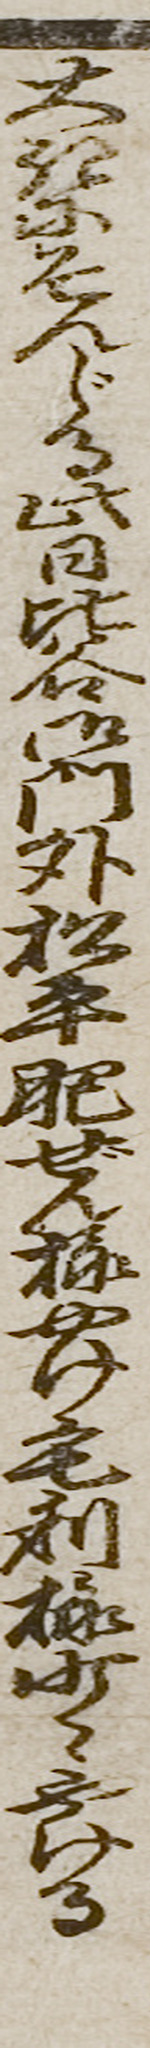大きにそんじる此日比谷御門外松平肥ぜん様ゆけ毛利様少々やける
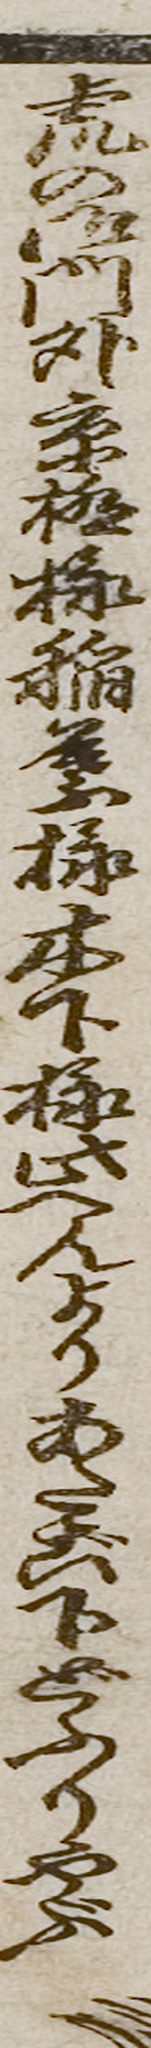虎の御門外京極様稲葉様木下様此へんよりあたご下どふりやぶ
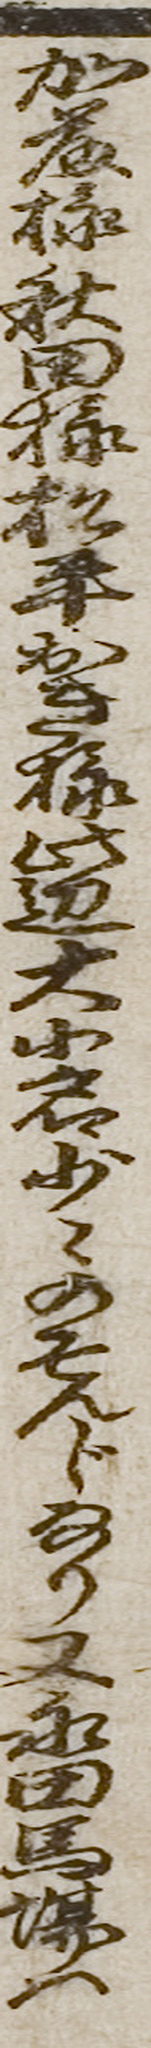加藤様秋田様松平おき様此辺大小名少々のそんじなり又永田馬場は
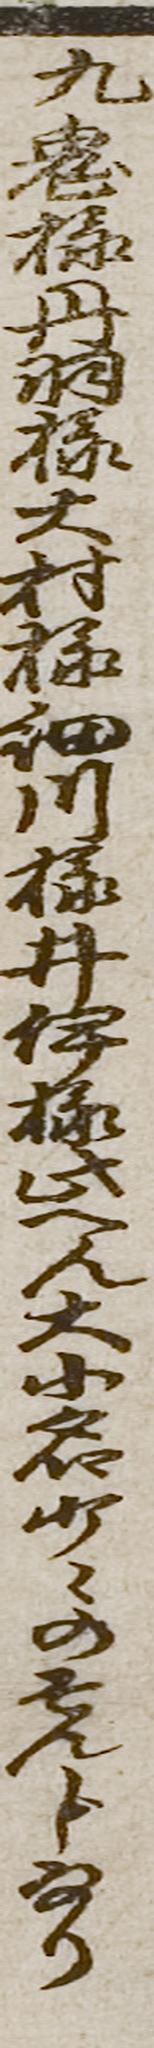九鬼様丹羽様大村様細川様井伊様此へん大小名少々のそんじなり
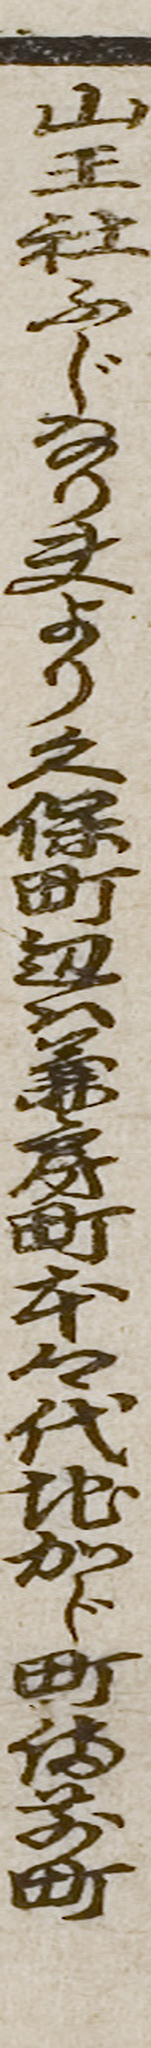山王社ふじなり夫より久保町辺は兼房町本郷代地かじ町備前町
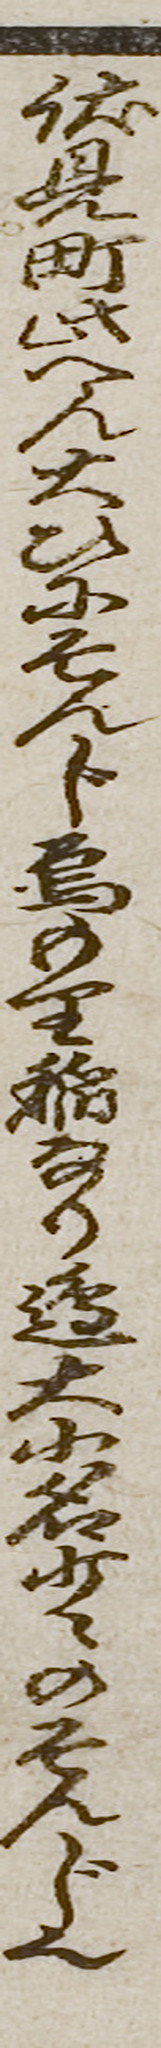伏見町此へん大ひにそんじ烏もり稲なり辺大小名少々のそんじ也
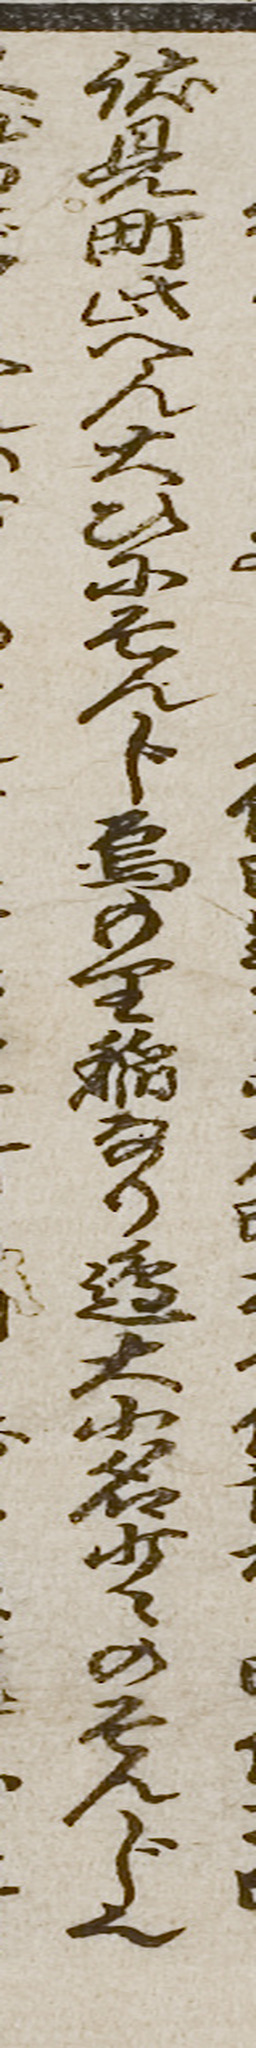伏見町此へん大ひにそんじ烏もり稲なり辺大小名少々のそんじ也
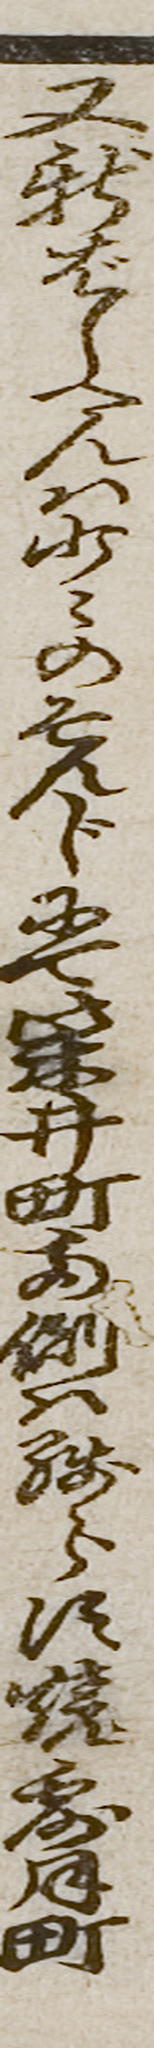又新ばしへんは少々のそんじにて柴井町両側は残らす焼露月町
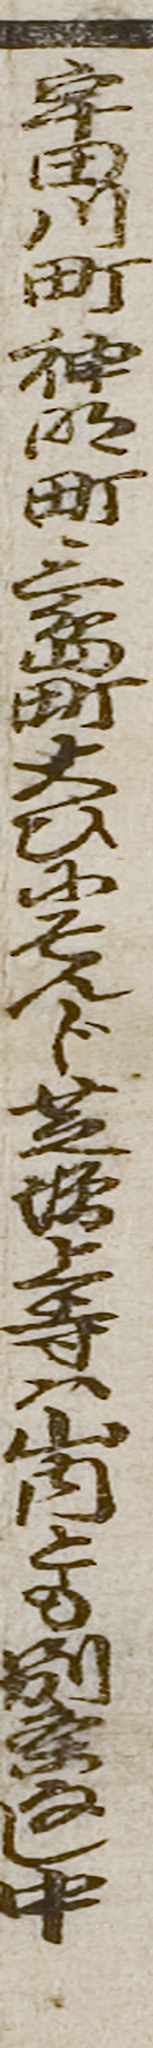宇田川町神明町三島町大いにそんじ芝増上寺は山内とも別条なし中
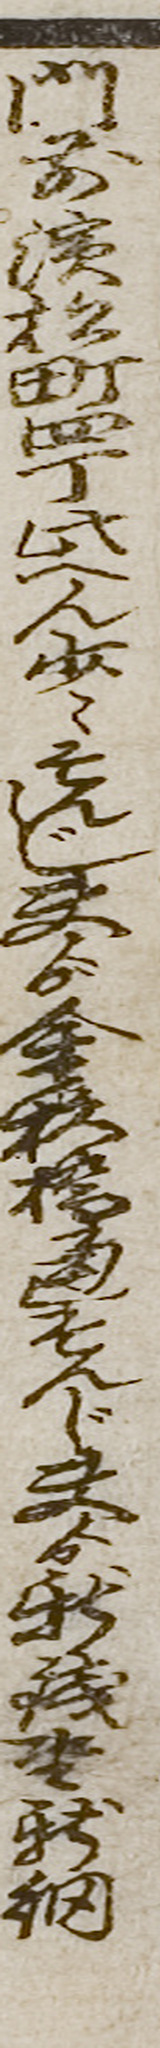門前浜松町四丁此へん少々そんじ夫ゟ金杉橋通そんじ夫ゟ新銭座新網
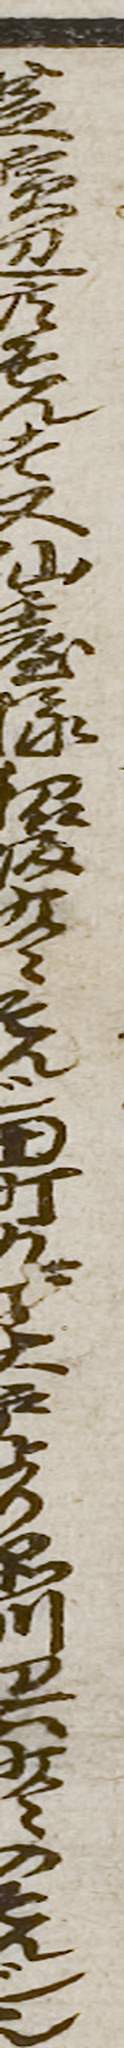芝浜辺共そんす又仙台様脇坂少々そんじ田町九丁大戸より品川辺は少々のそんじ也
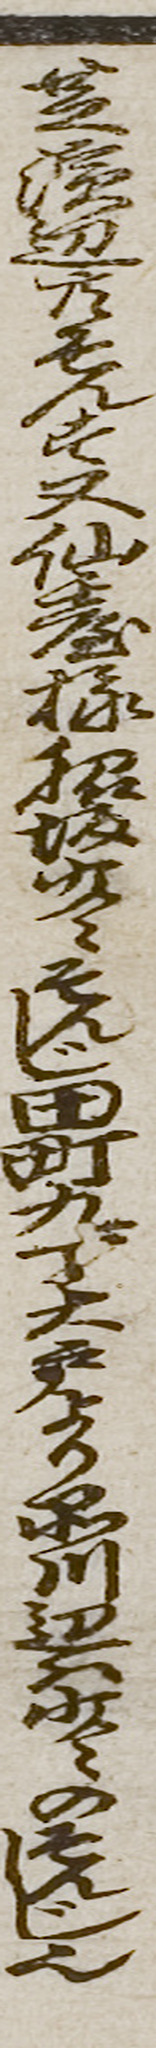芝浜辺共そんす又仙台様脇坂少々そんじ田町九丁大戸より品川辺は少々のそんじ也
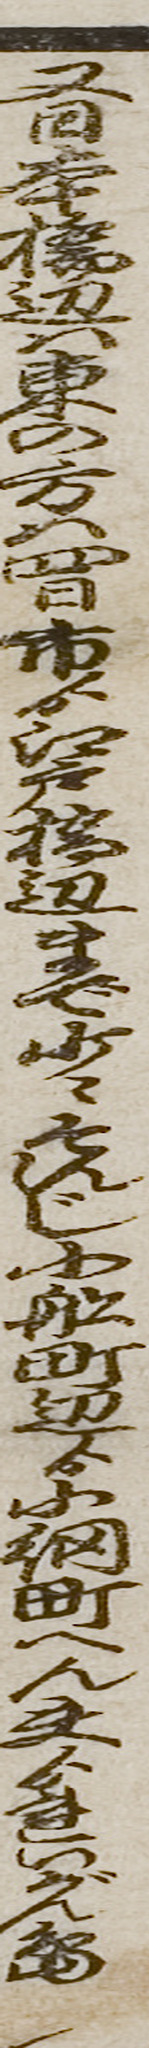又日本橋辺は東の方は四日市ゟ江戸橋辺まで少々そんじ小船町辺ゟ小網町へん夫ゟれいがん島
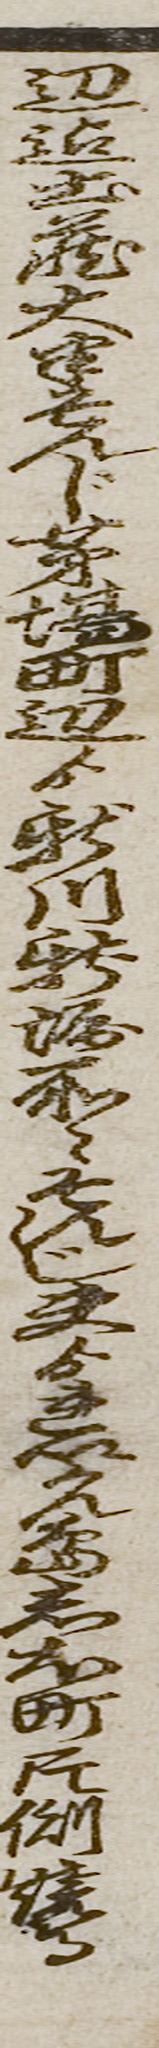辺迄土蔵大半そんじ茅場町辺ゟ新川新堀所々そんじ夫ゟれいかん島しほ町片側焼る
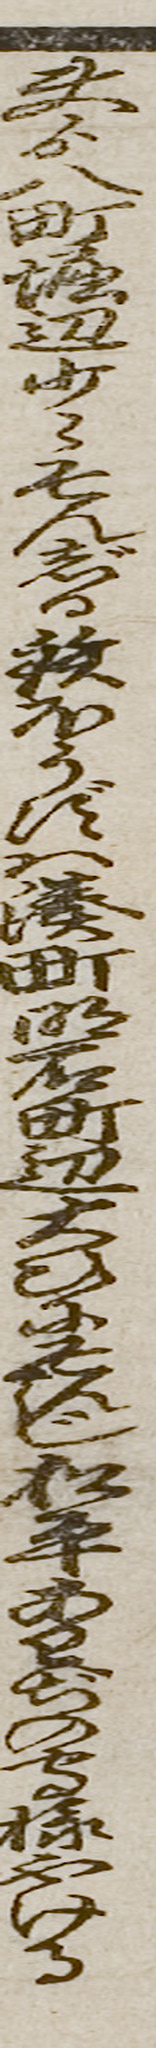夫ゟ八町堀辺少々そんじる鉄ほうずは湊町明石町辺大ひにそんじ松平あわぢの守様やける
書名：江戸大地震出火場所分
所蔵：東京大学総合図書館 General Library in the University of Tokyo, JAPAN
